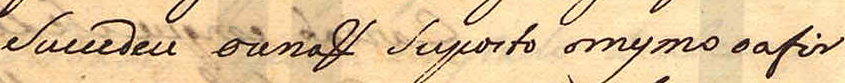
succedeu ou naõ suposto o mesmo o afir
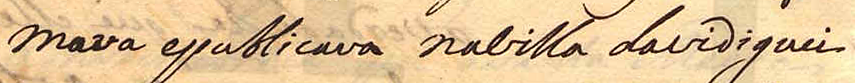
mava e publicava na villa da vidiguei
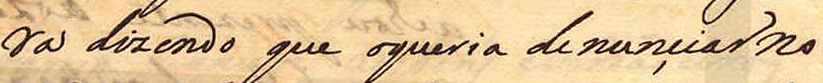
ra dizendo que o queria denunciar no
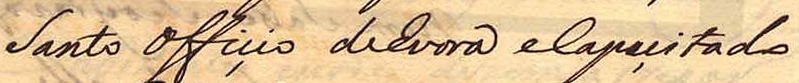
Santo Officio de Evora e Capacitado
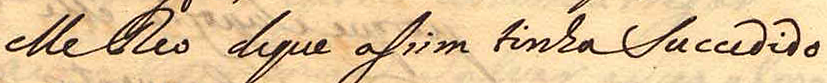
elle Reo de que assim tinha Succedido
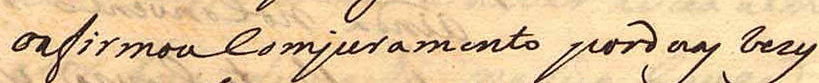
o afirmou Com juramento por duas vezes
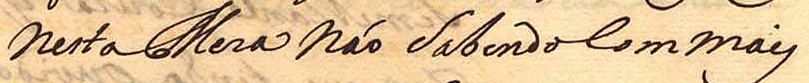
nesta Meza naõ sabendo Com mais
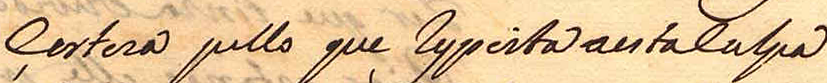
Certeza pello que respeita a esta culpa
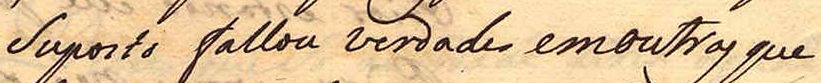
suposto fallou verdade em outras que
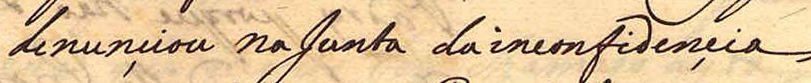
denunciou na Junta da inconfidencia
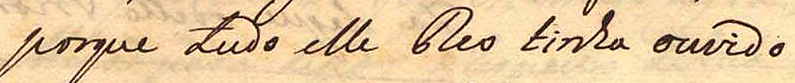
porque tudo elle Reo tinha ouvido
